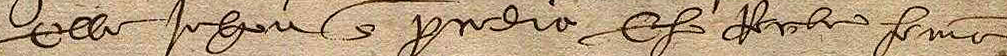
Elle Julgou q̄ ꝓcedia E ho Recebeo he mā
